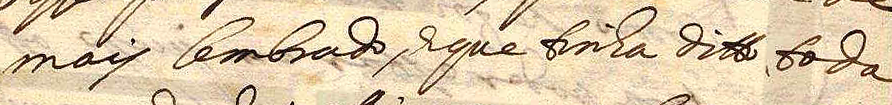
mais lembrado, E que tinha ditto toda
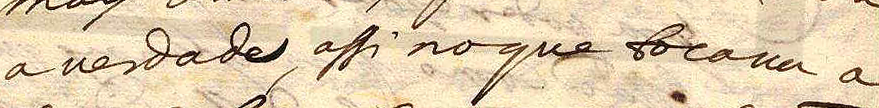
a uerdade assi no que tocaua a
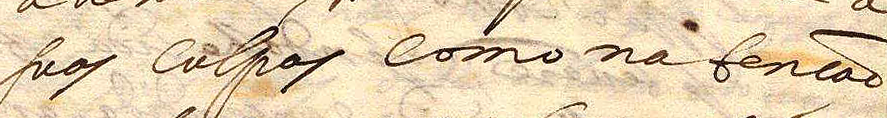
suas culpas como na tenção
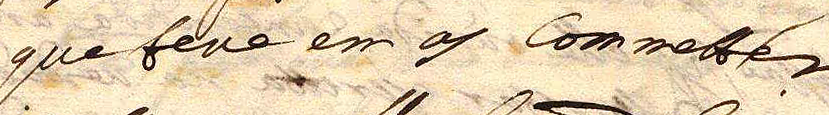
que teue em as commetter
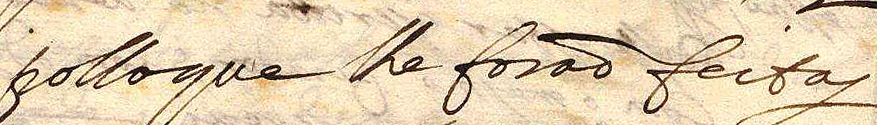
pollo que lhe forão feitas
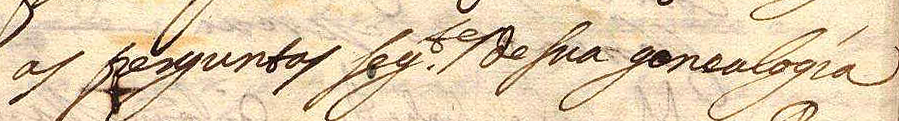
as perguntas seg.tes de sua genealogia
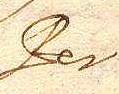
Per
